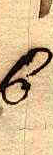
6
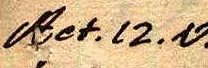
Ret. 12.V.
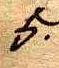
5.
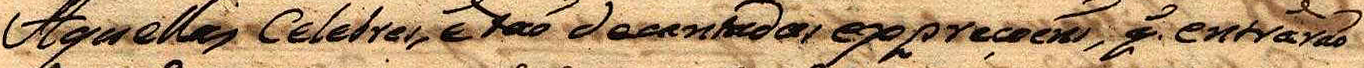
Aquellas Celebres, ê taõ decantadas expreçoeñs, q̄. entrâraõ
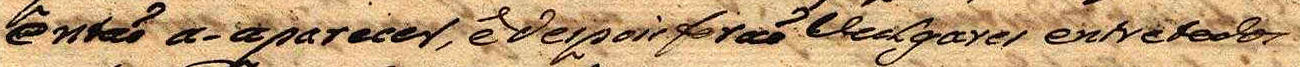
entaõ a-aparecer, ê despois foraõ Vulgares entre todos
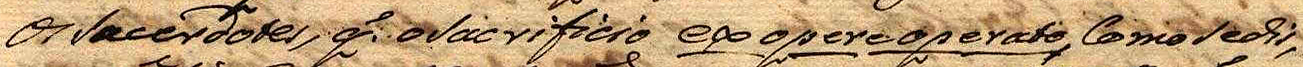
os sacerdotes, q̄ o sacrificio ex opere operato, Como se dis,
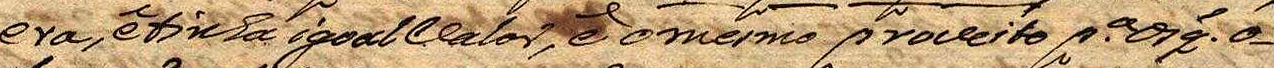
era, ê tinha igoal Valor, ê o mesmo proveito p.a os q̄. o
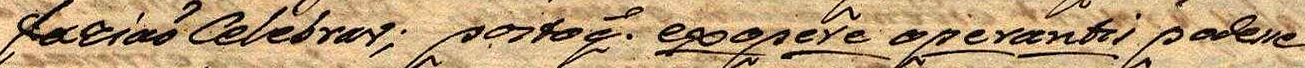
faziaõ Celebrar; posto q̄. ex opere operanti podesse
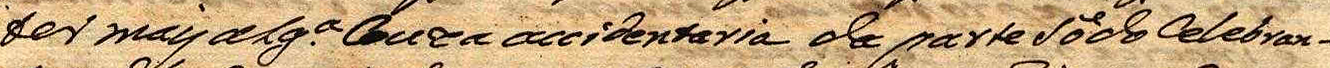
ter mais alg.a Couza accidentaria da parte sô do Celebran
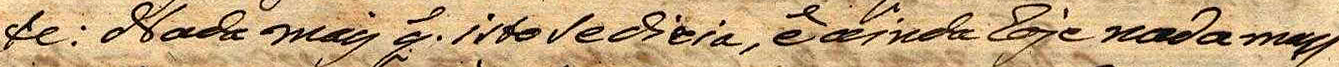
te: Nada mais q̄. isto se dizia, ê ainda hoje nada mais
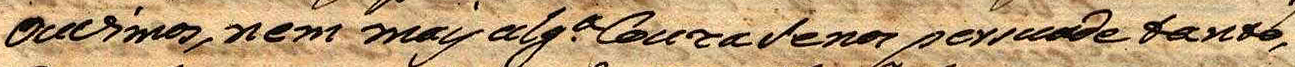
ouvimos, nem mais alg.a Couza se nos persuade tanto,
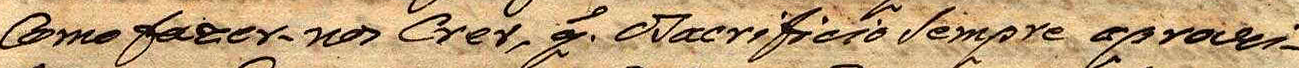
Como fazer-nos Crer, q̄ o sacrificio sempre aprovei
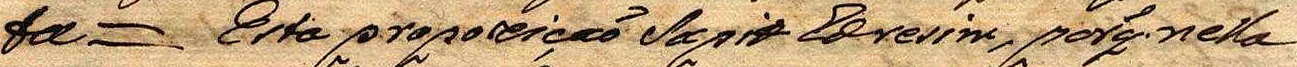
ta = Esta propoziçaõ sapit haeresim, porq̄ nella
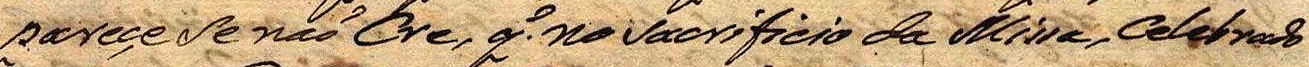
pareçe se naõ cre, q̄ no sacrificio da Missa, celebrando
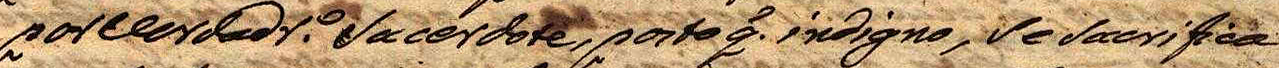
por verdadr.o sacerdote, posto q̄. indigno, se sacrifica
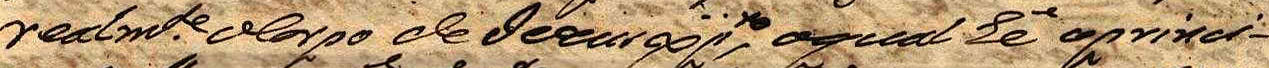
realm.te o corpo de Iezus xpto, o qual hê o princi
